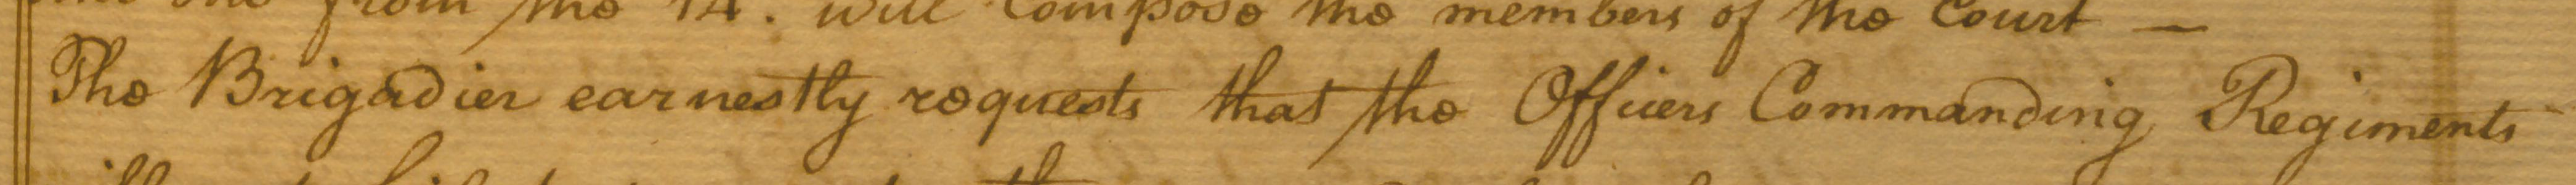The Brigadier earnestly requests that the Officers Commanding Regiments
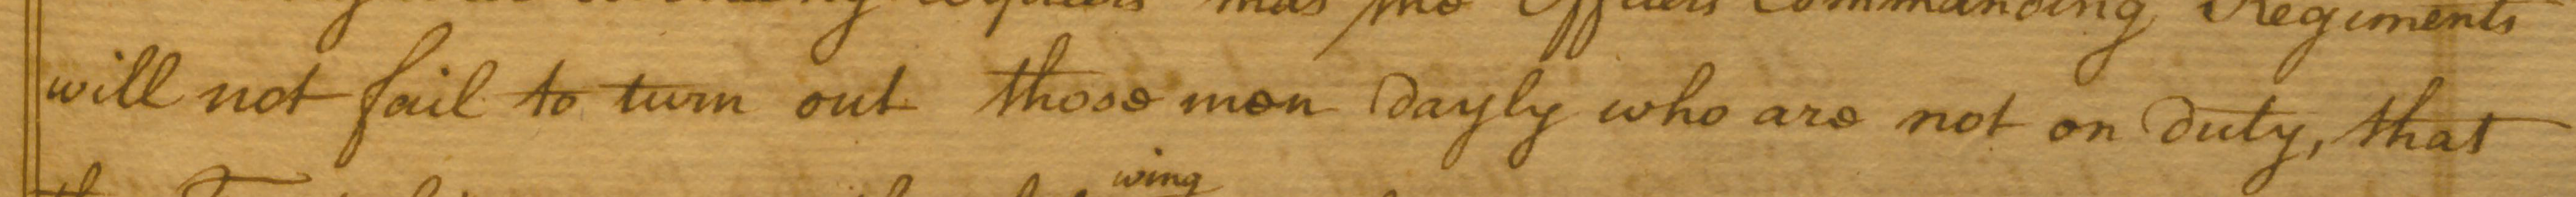will not fail to turn out those men dayly who are not on duty, that
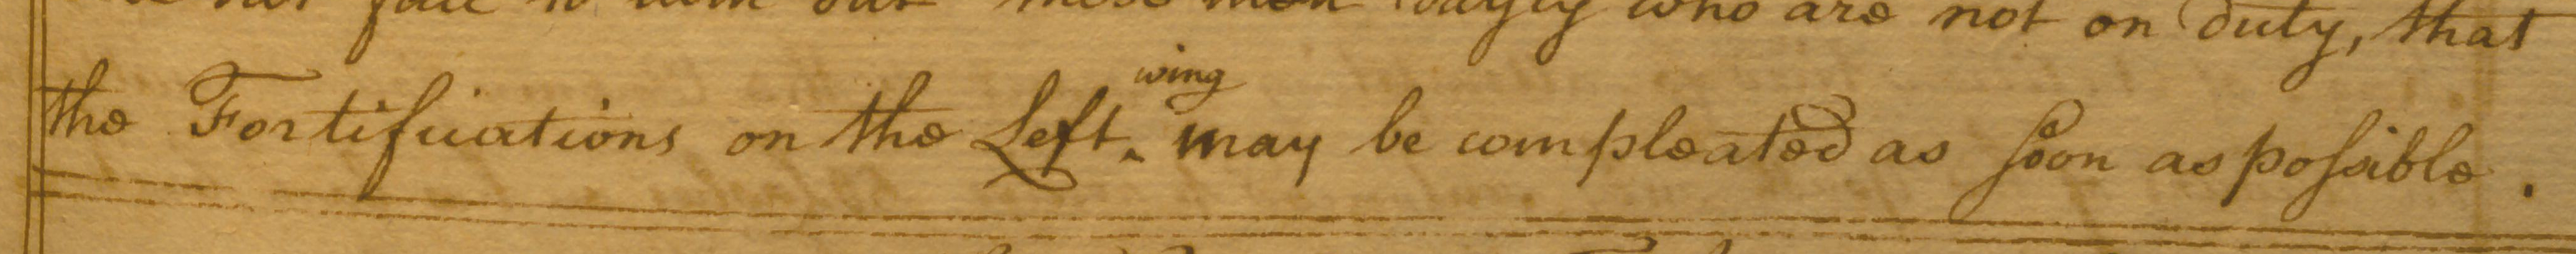the Fortifications on the Left ^wing may be compleated as soon as possible.
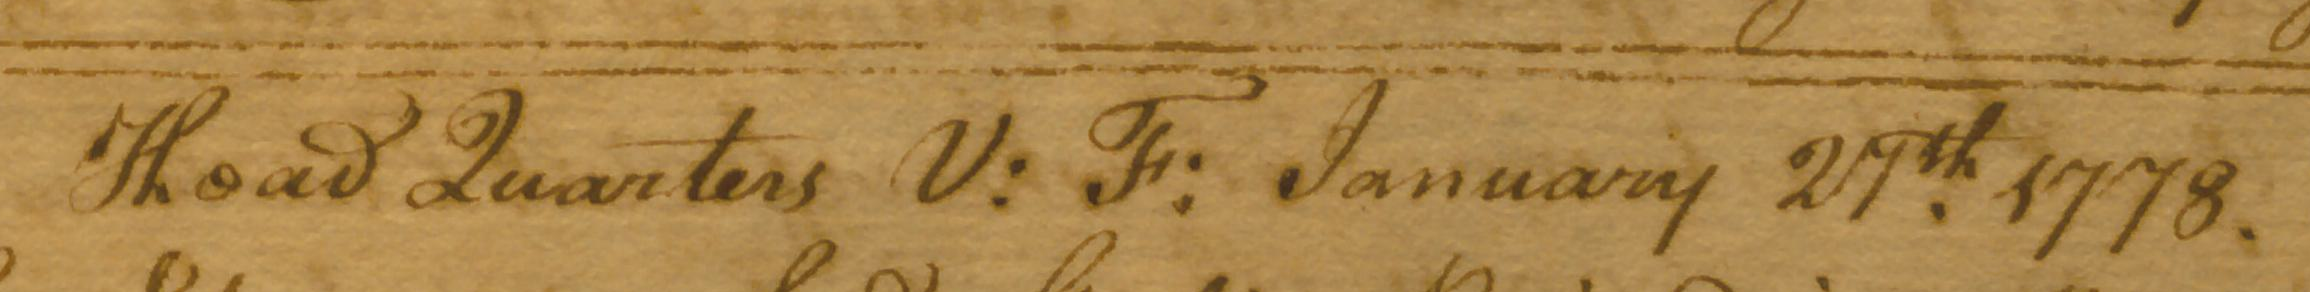Head Quarters V: F: January 27^th. 1778.
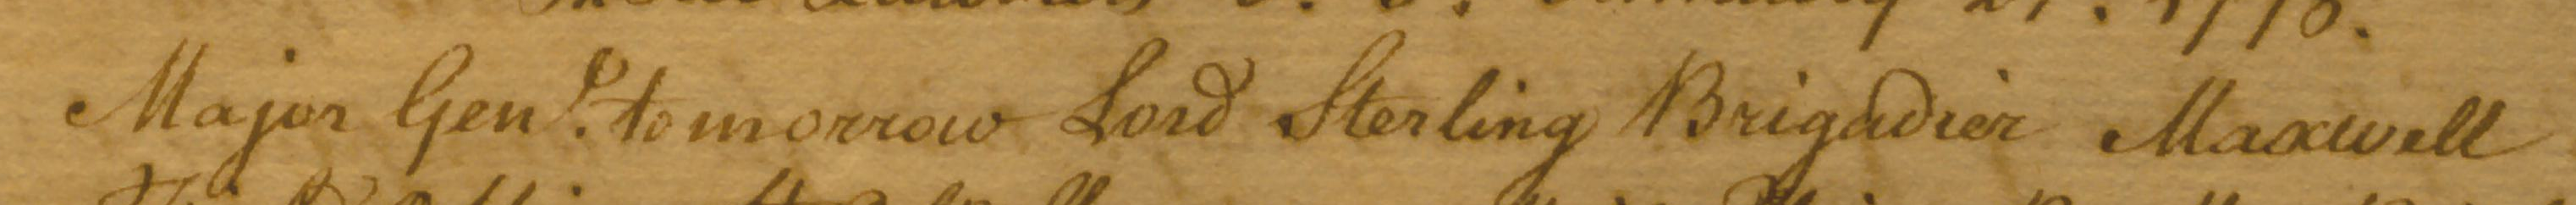Major Gen^l. tomorrow Lord Sterling Brigadier Maxwell
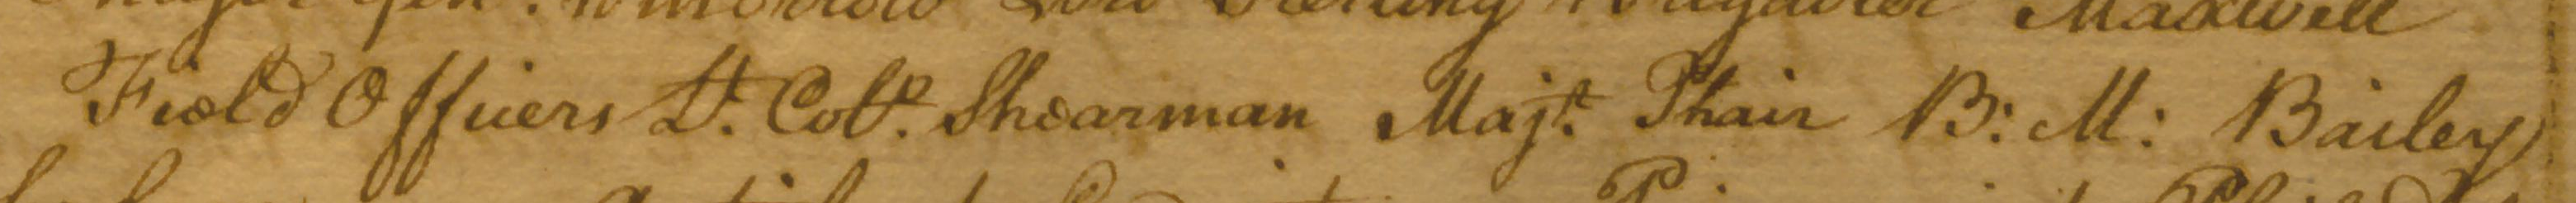Field Officers L^t. Col^o. Sharman Maj^r. Thair B: M: Bailey
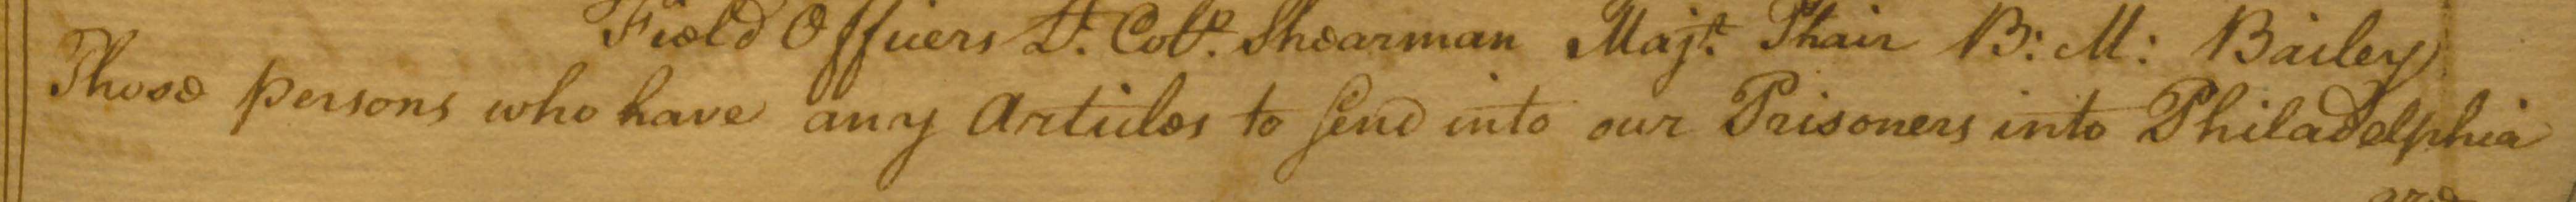Those persons who have any Articles to send into our Prisoners into Philadelphia
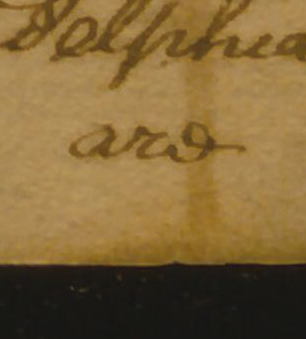are
